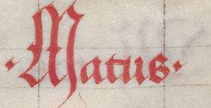.Matus.
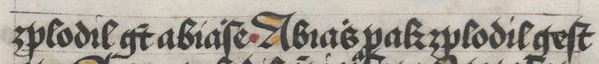zplodil ḡt abíaẛe.Abiaṡ pak zplodíl geſt
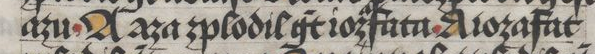azu.A aza zplodil ḡt iozafatu.A iozafat
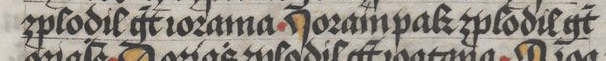zplodil ḡt iorama.Ioram pak zplodil ḡt
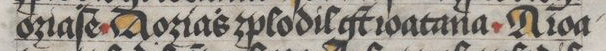oziaẛe.A ozíaṡ zplodil ḡt ioatana.A ioa¬
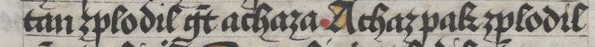tan zplodil ḡt achaza.Achaz pak zplodil
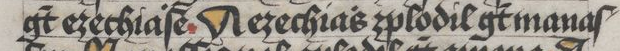ḡt ezechiaẛe.A ezechíaṡ zplodil ḡt manaſ¬
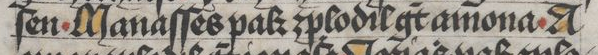ſen.Manaſſes pak zplodil ḡt amona.A
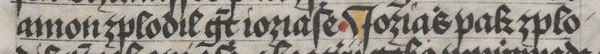amon zplodil ḡt ioziaẛe.Joziaṡ pak zplo¬
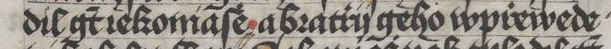dil ḡt iekomíaẛe.a bratṙíj geho wpṙewede¬
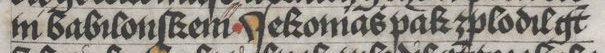ní babilonſkem.Jekoníaṡ pak zplodil ḡt
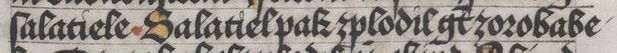ſalatiele.Salatiel pak zplodil ḡt zorobabe
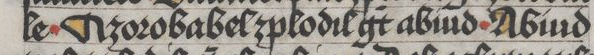le.A zorobabel zplodil ḡt abiud.Abiud
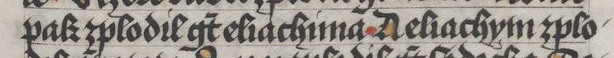pak zplodil ḡt eliachima.A eliachym zplo¬
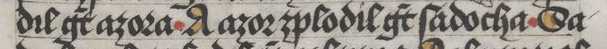dil ḡt azora.A azor zplodil ḡt ſadodocha.Sa¬
